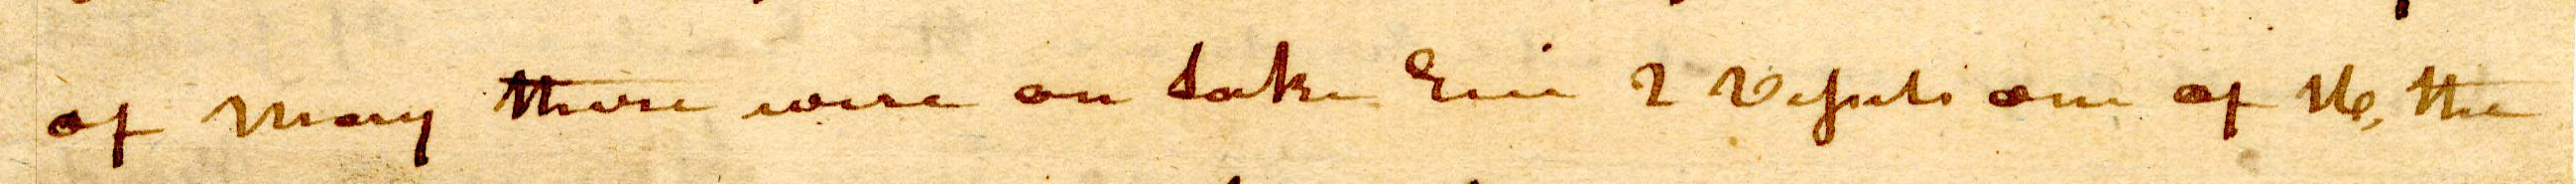of many those were on Lake Erie 2 Nights as of 16, the
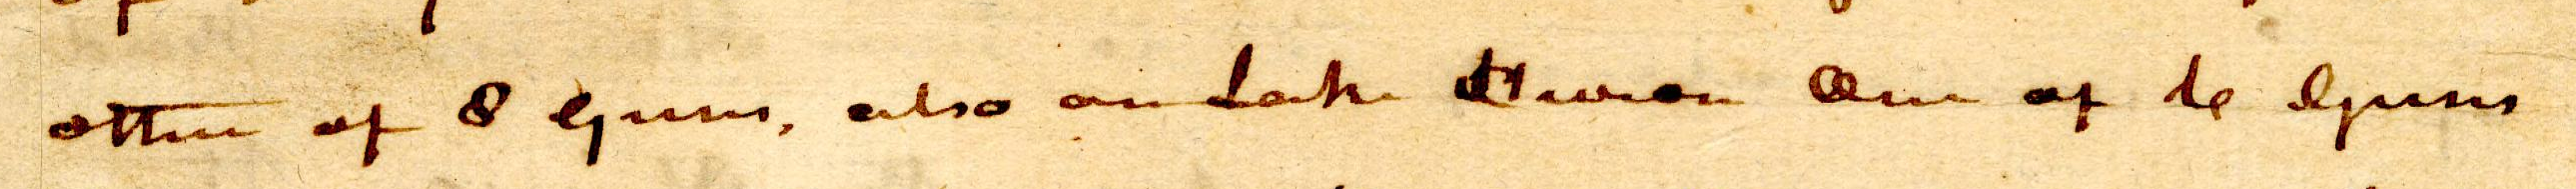other of 8 Guns, also on Lake Huron One of 6 Guns
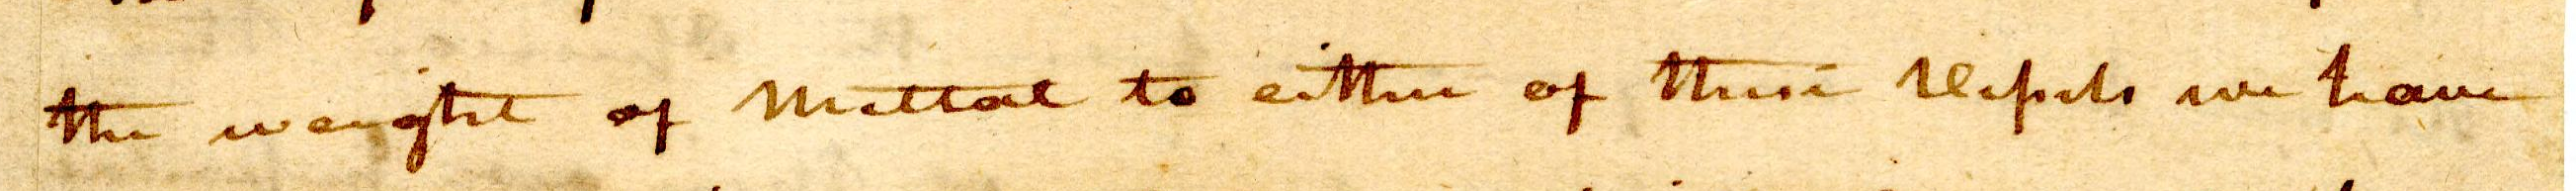the weight of mettal to either of these respects we have
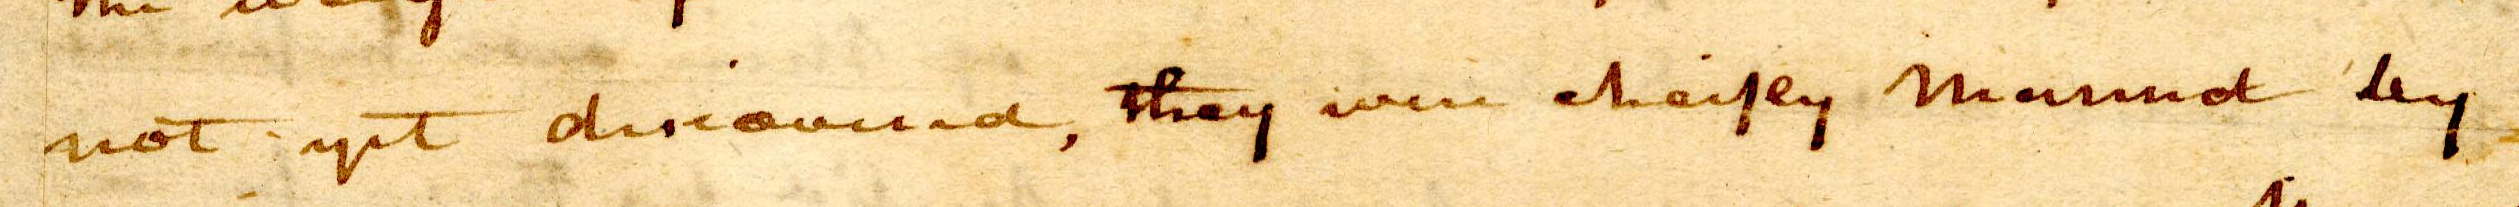not yet discovered, they were cheifly manned by
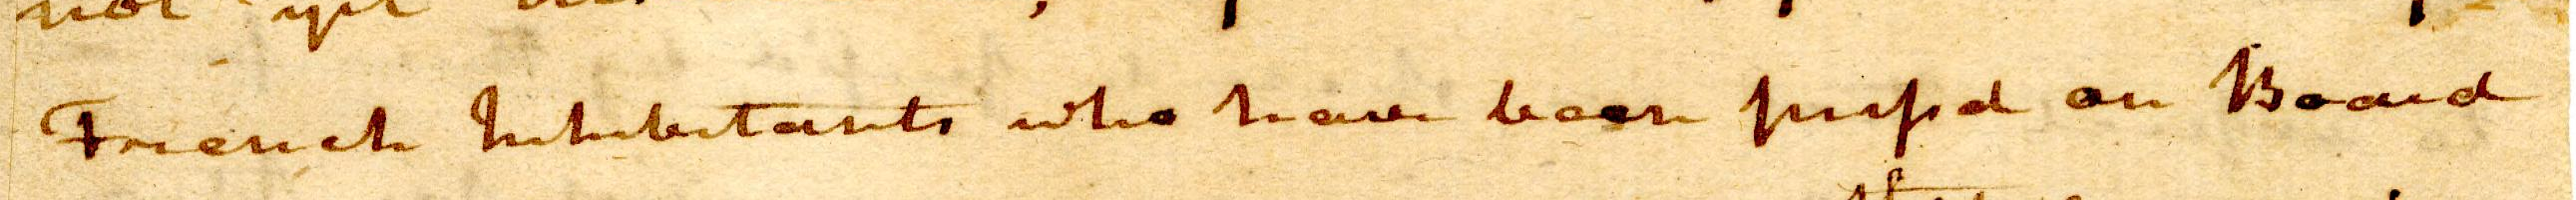French inhabitants who have been pressed on Board
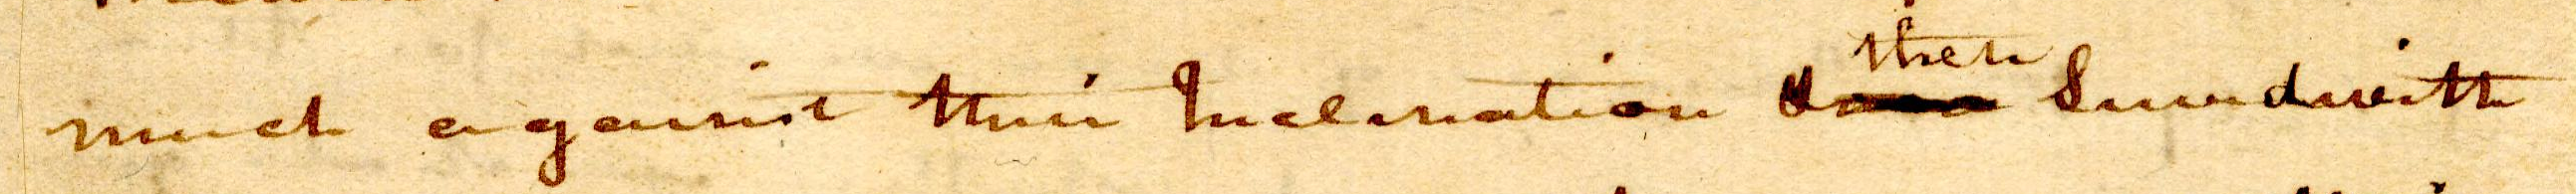much against their Inclination & [___] Saved with
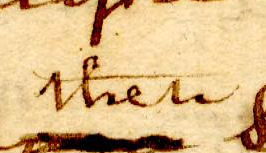then
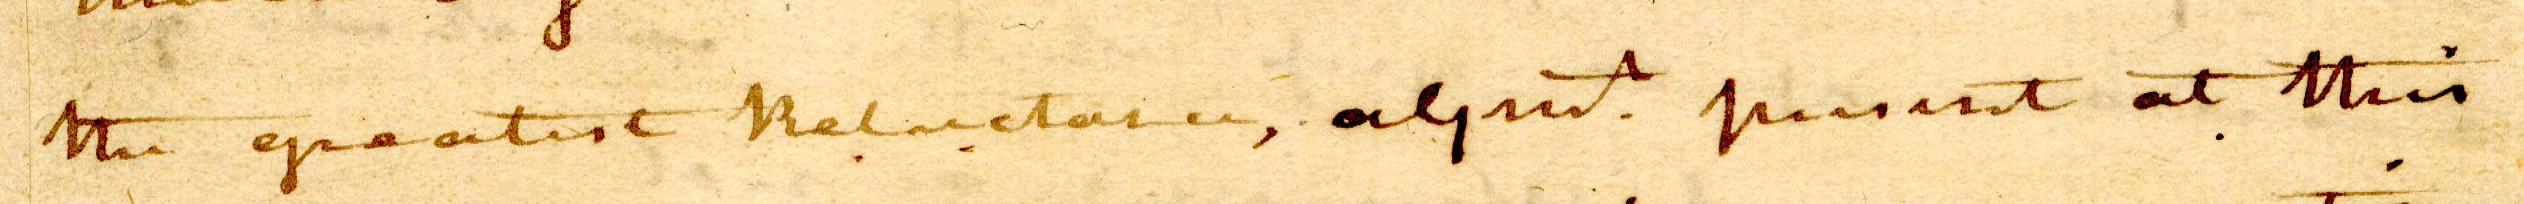the greatest Reluctance, against present at this
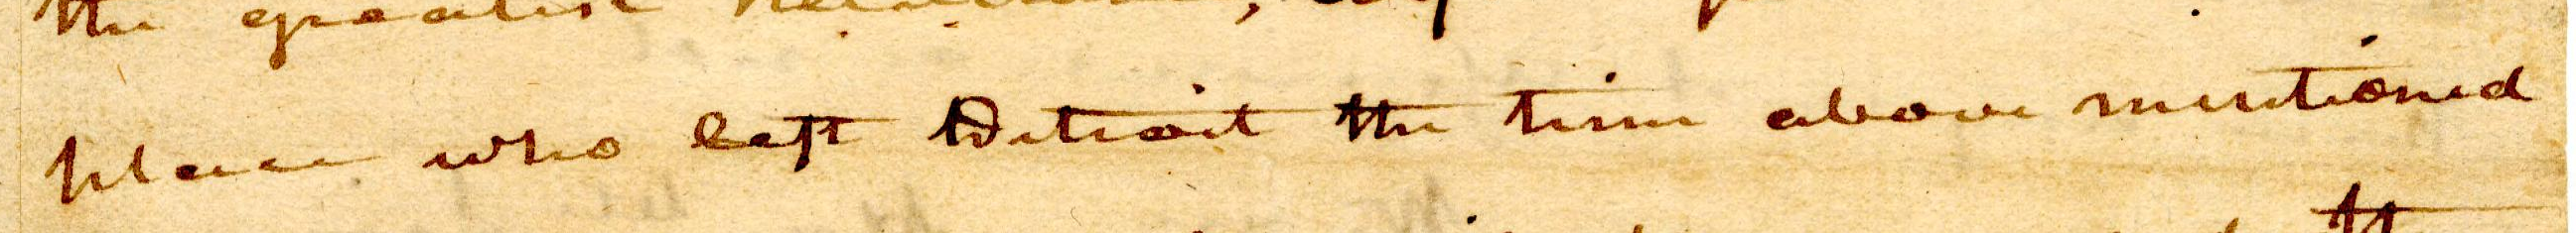place who left Detroit the time above mentioned
